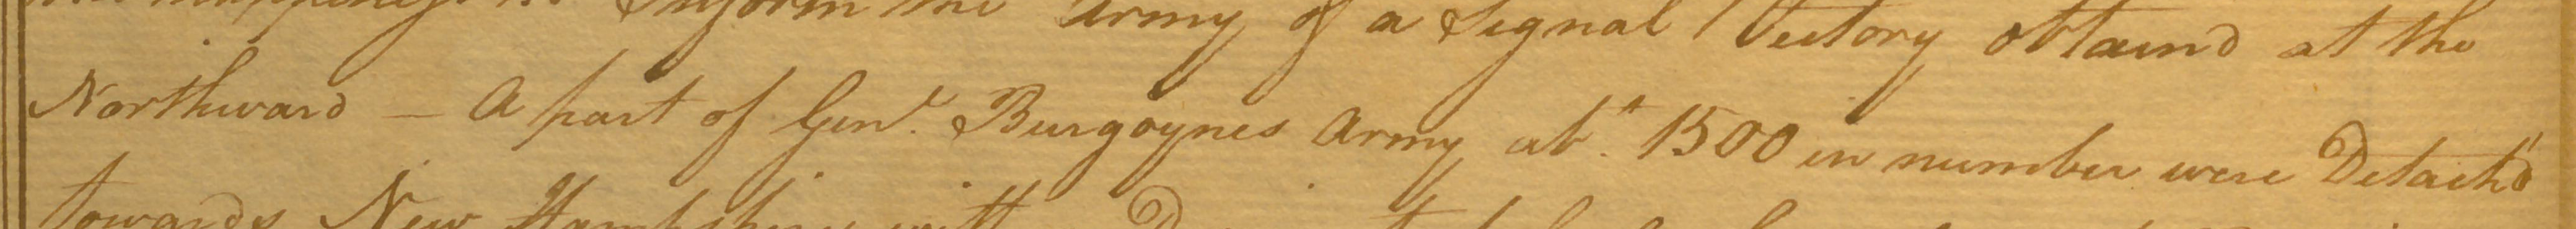Northward- A part of Gen^l. Burgoynes army ab^t. 1500 in number were Detach'd
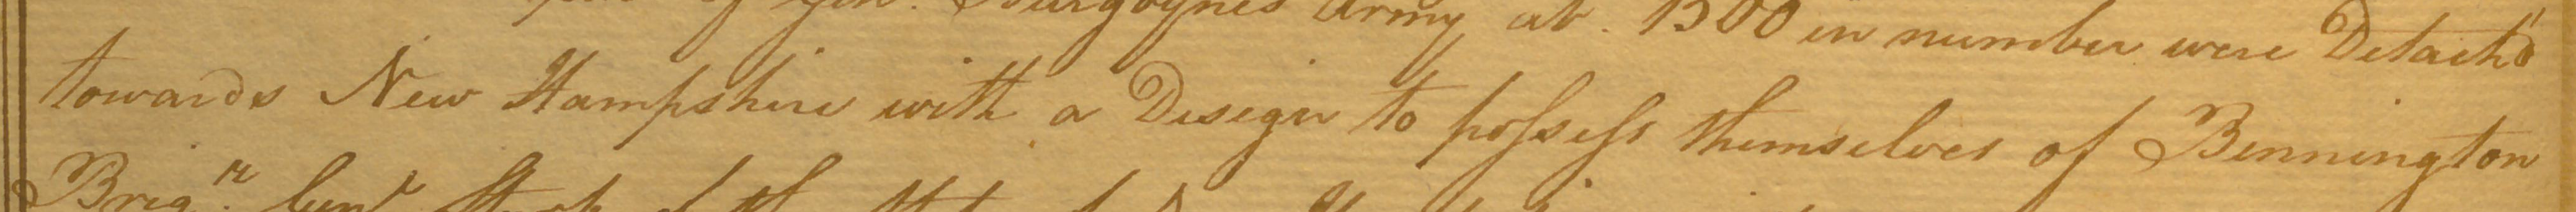towards New Hampshire with a Design to possess themselves of Bennington
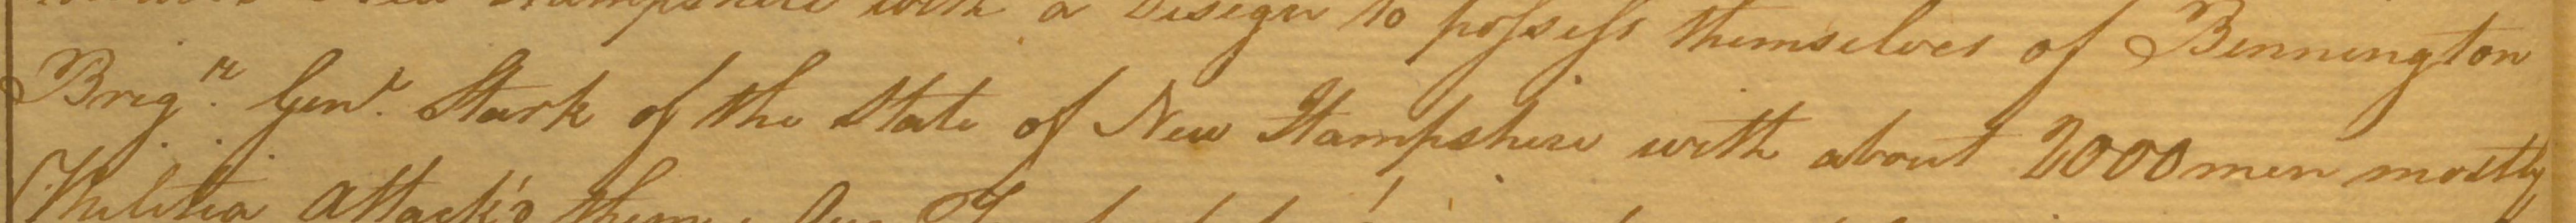Brig^r. Gen^l. Stark of the State of New Hampshire with about 2000 men mostly
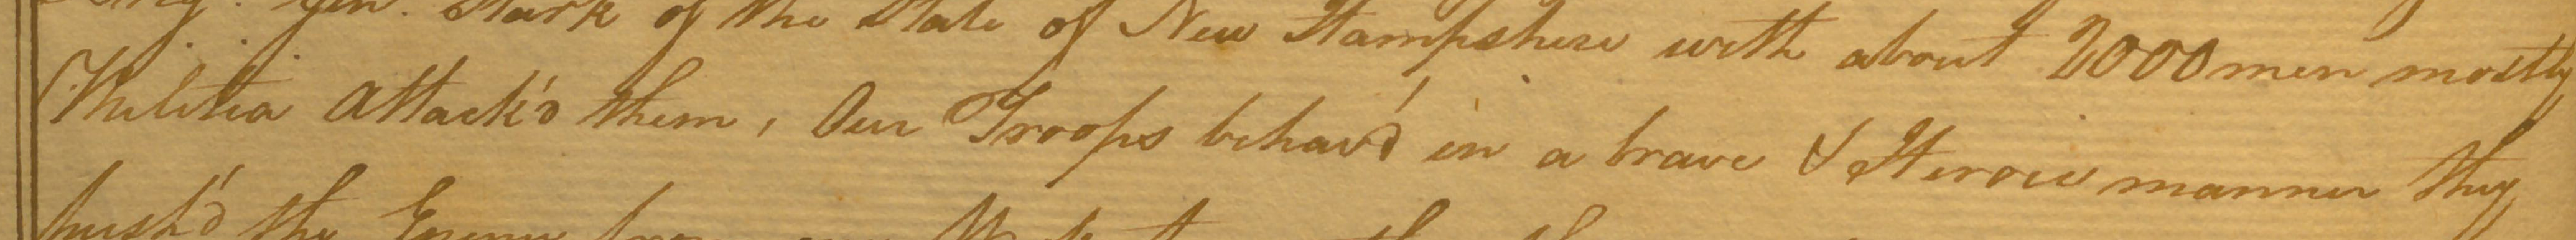Militia attack'd them, Our Troops behav'd in a brave & Heroic manner they
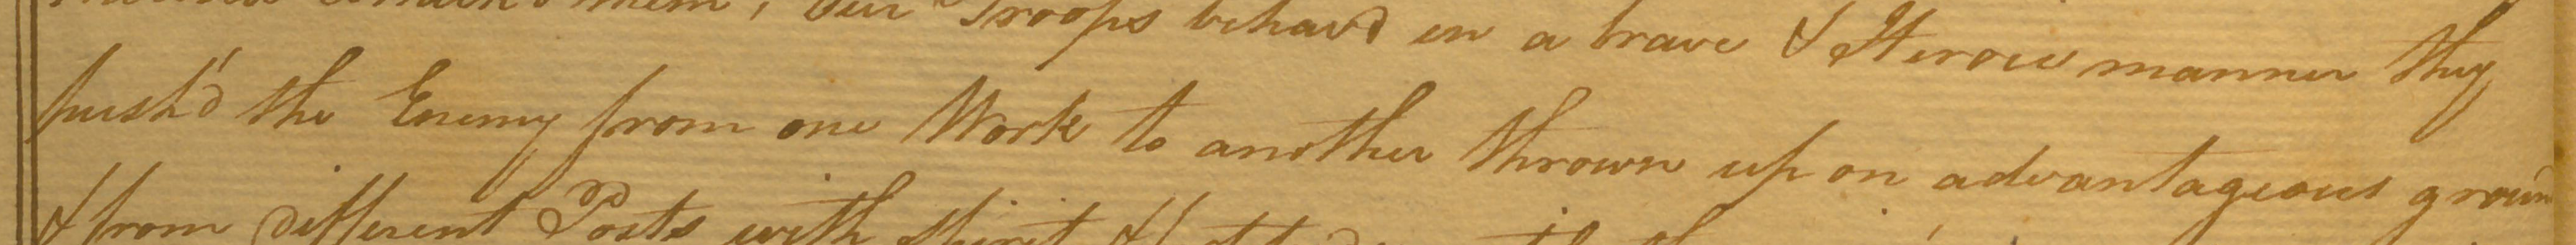push'd the Enemy from on Work to another thrown up on advantageous ground
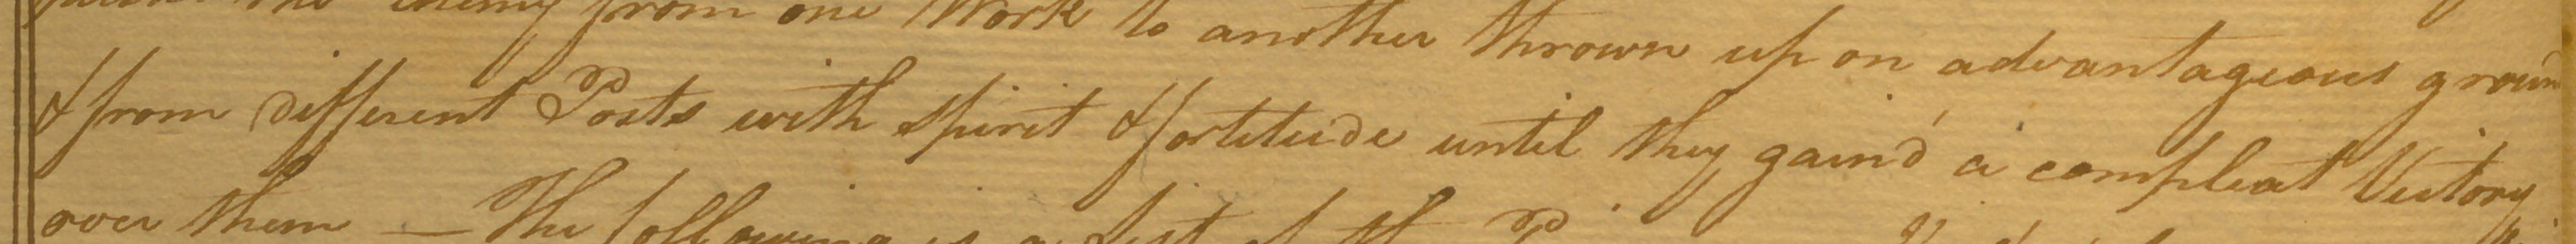& from different Posts with spirit of fortitude until they gain'd a compleat Victory
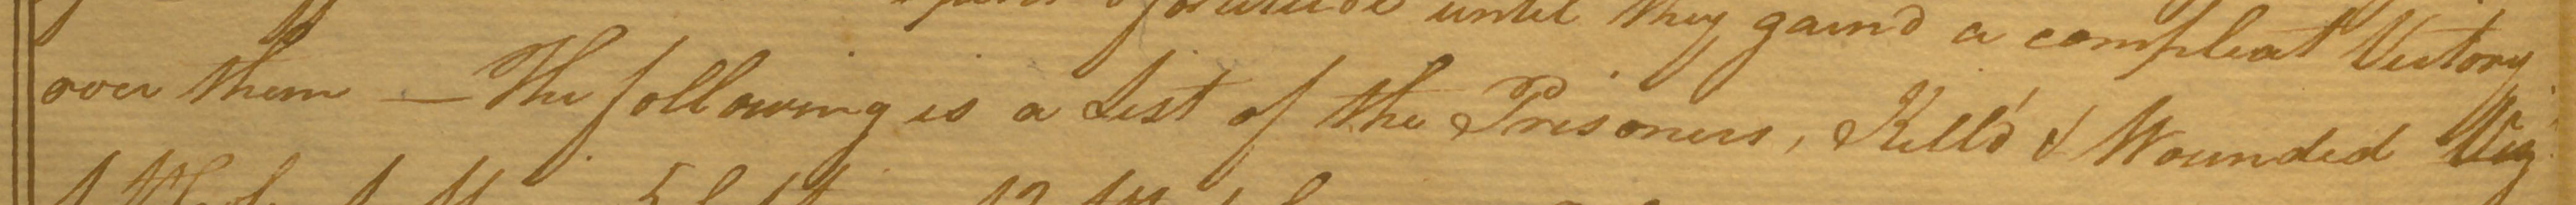over them- The following is a List of the Prisoners, Kill'd & Wounded Viz
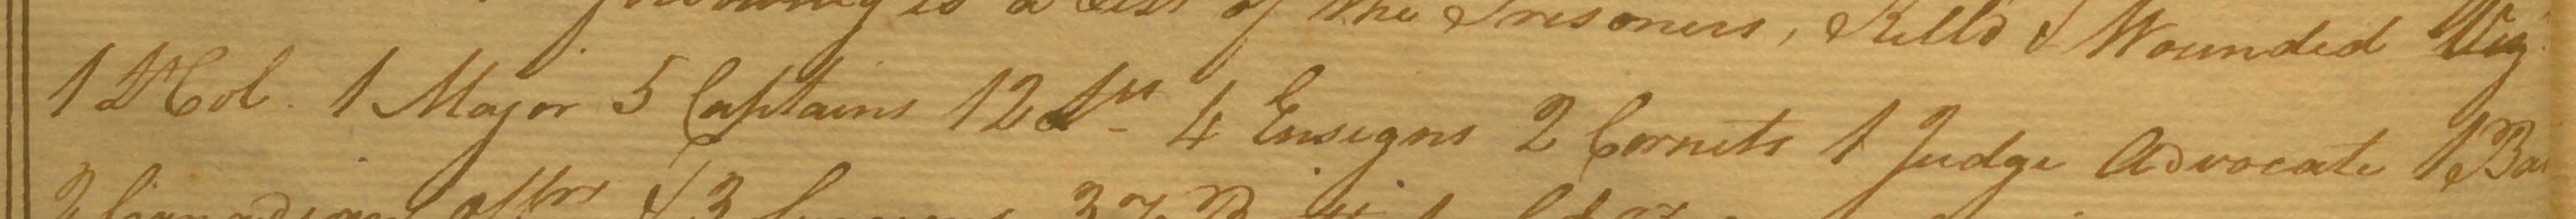1 L^t Col 1 Major 5 Captains 12 L^ts. 4 Ensigns 2 Cornets 1 Judge Advocate 1 Ba
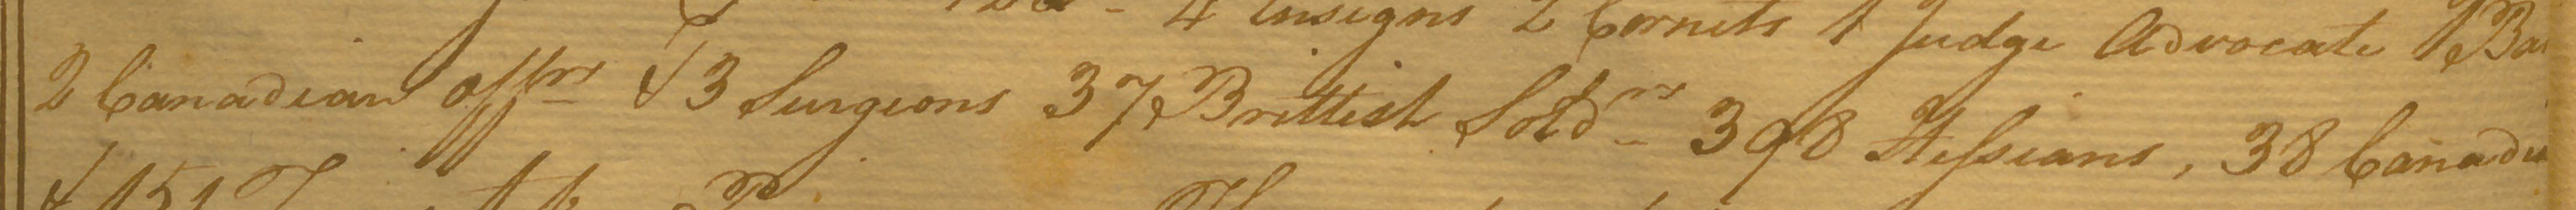2 Canadian Off^rs & 3 Surgeons 37 Brittish Sold^rs 398 Hessians, 38 Canadi
